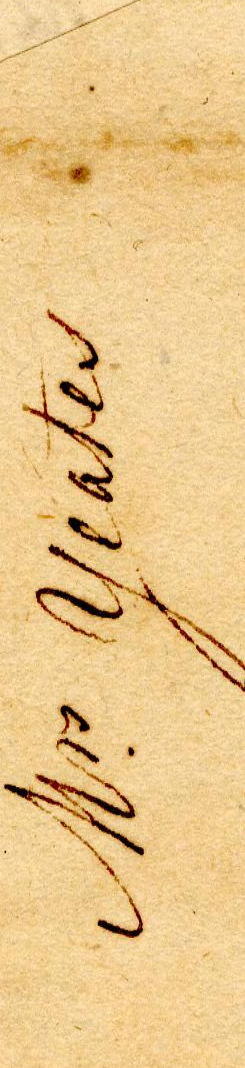M^rs. Yeates
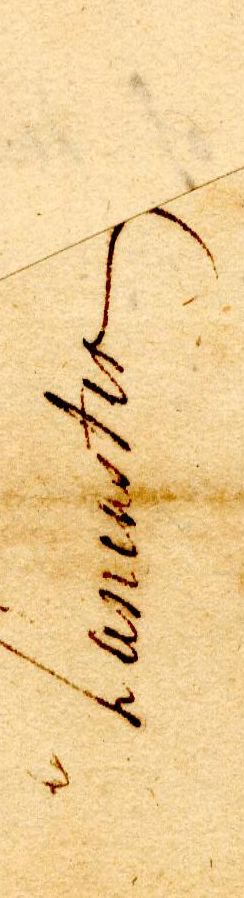Lancaster
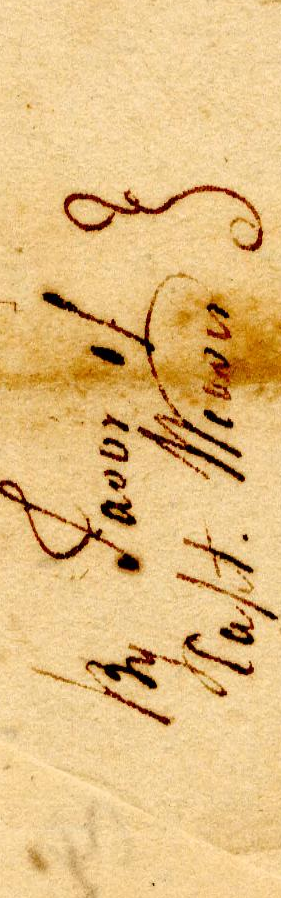By Favor of
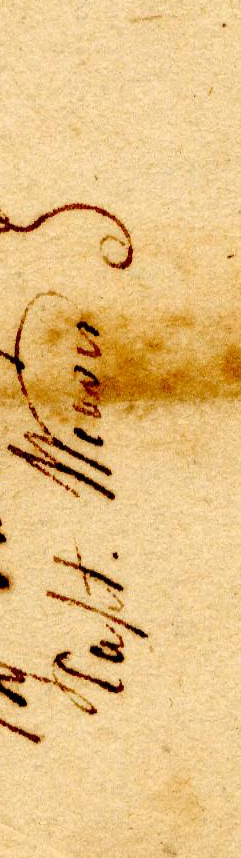Capt. Weaver
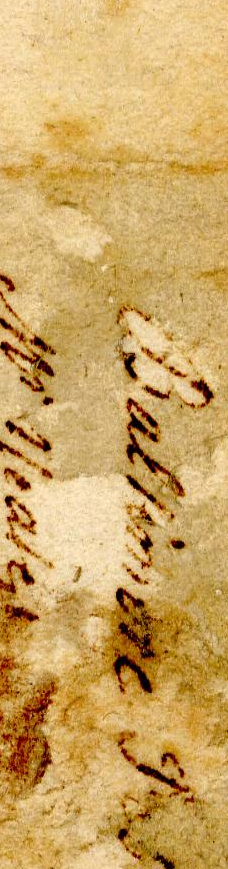Baltimore
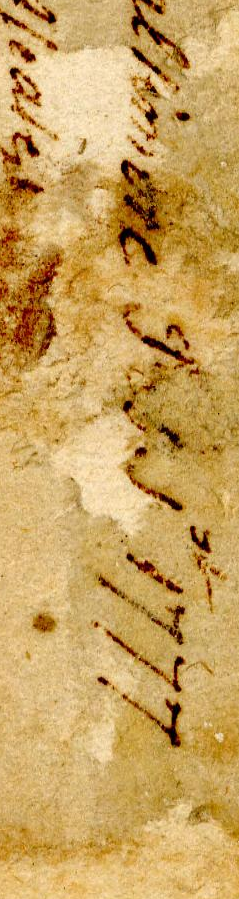Feb. 1^st 1777
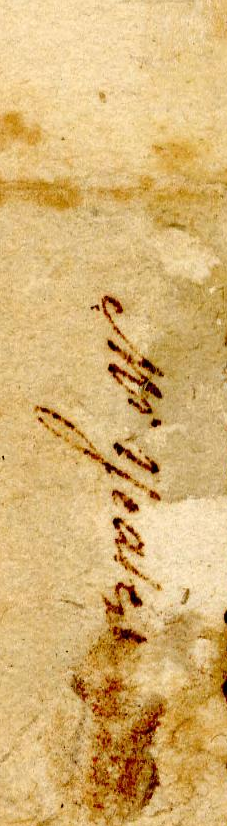M^r. Yeates
